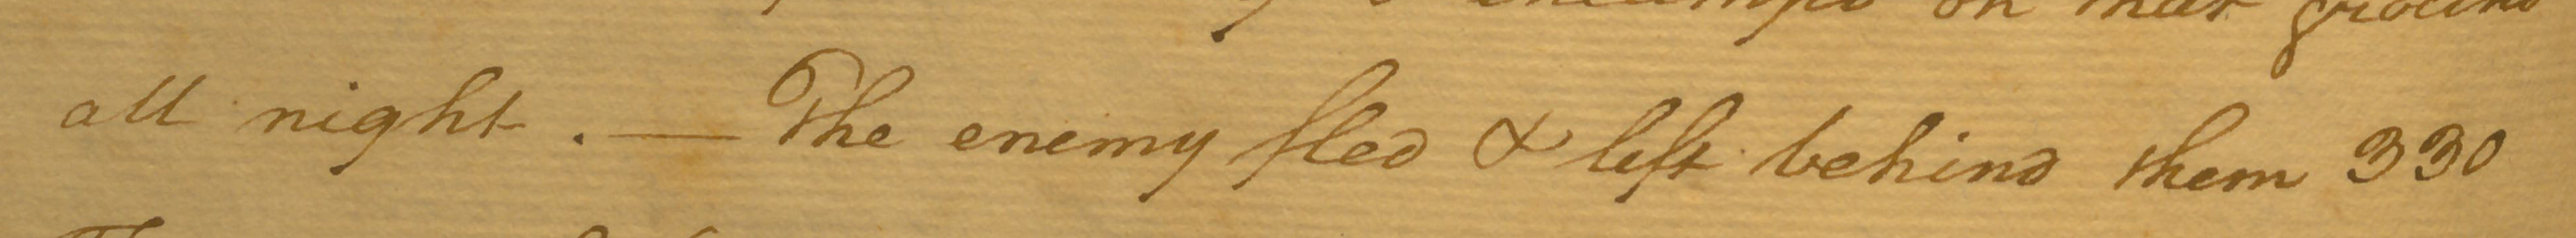all night.- The enemy fled & left behind them 330
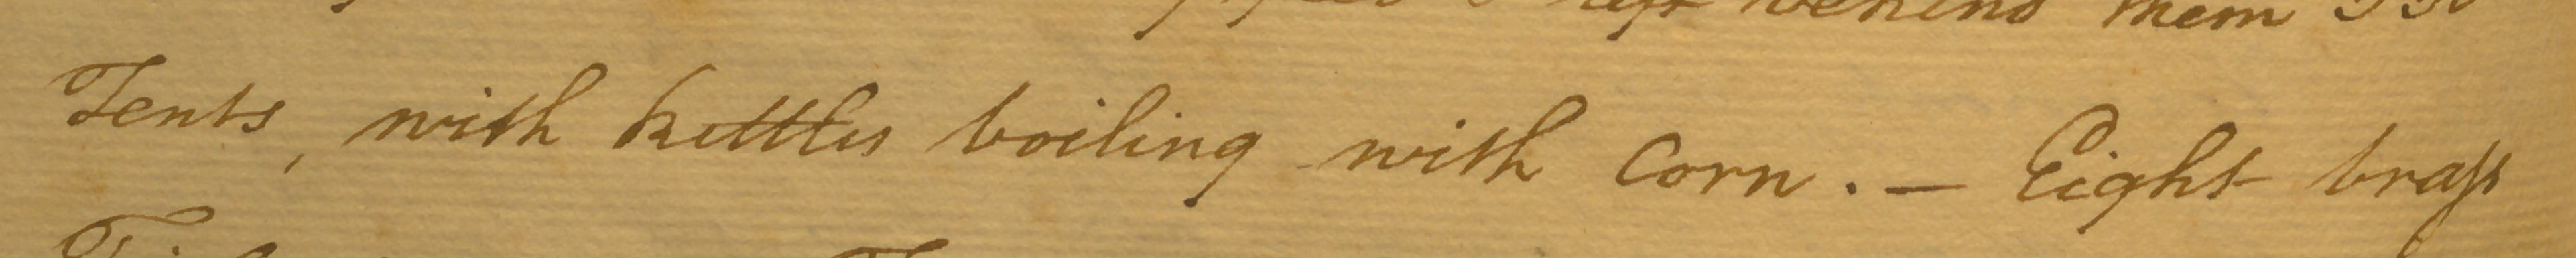Tents, with kettles boiling with corn.- Eight brass
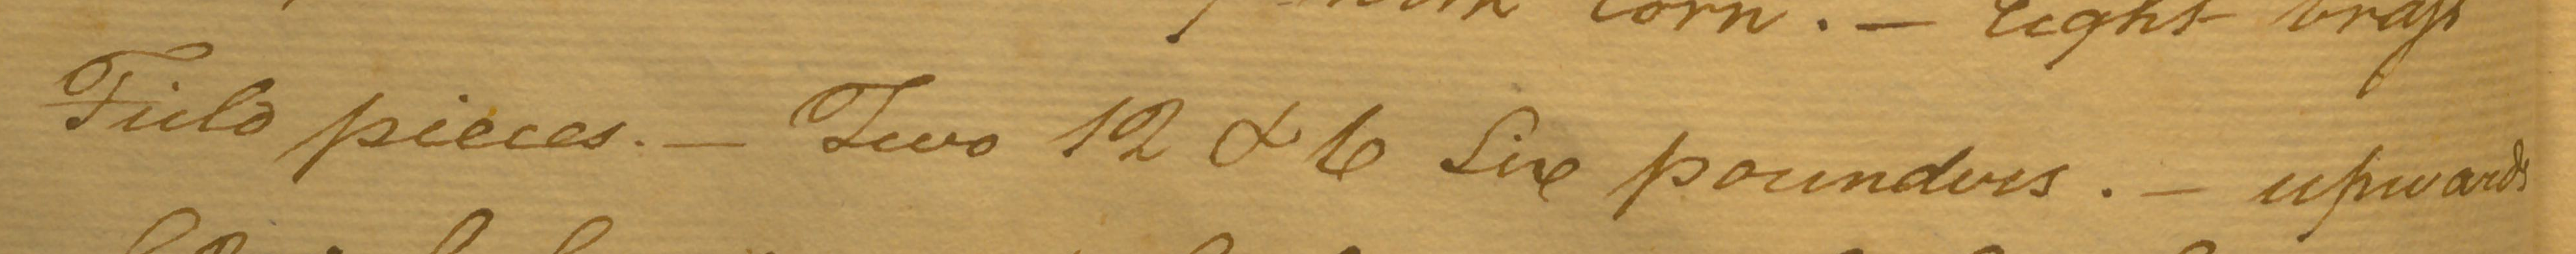Field pieces.- Two 12 & 6 six pounders.- upwards
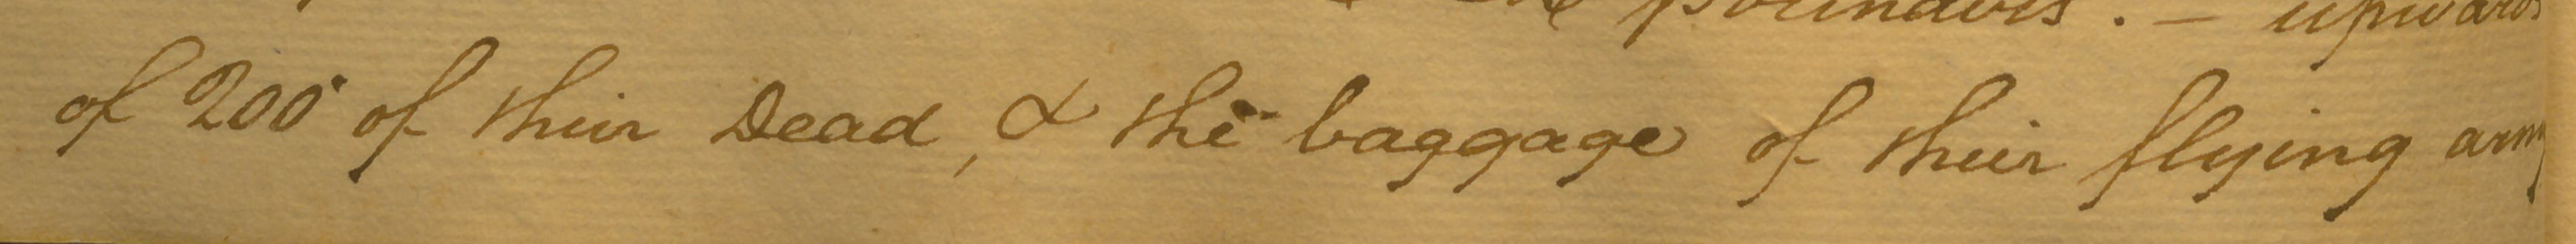of 200 of their dead & the & the baggage of their flying army
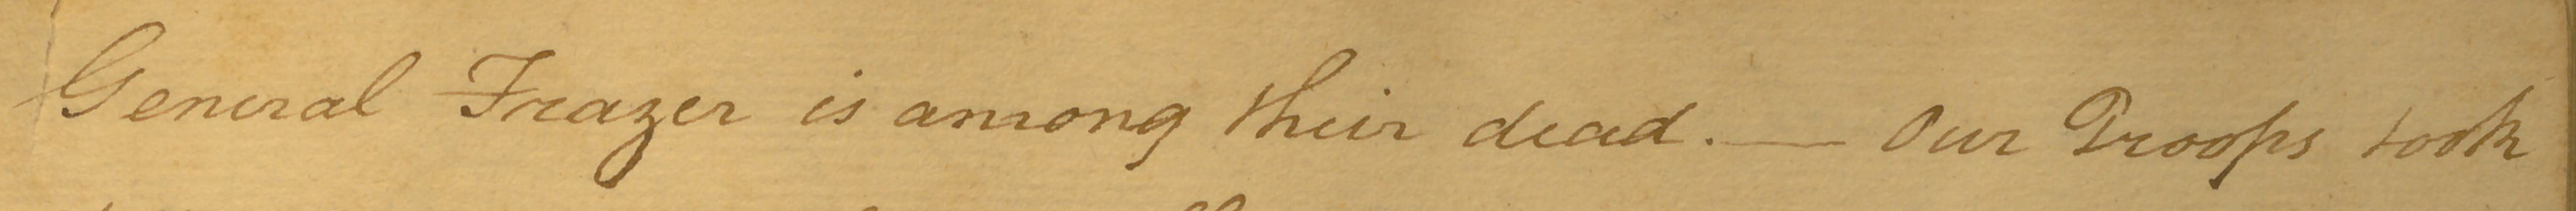General Frazer is among their dead.- Our Troops took
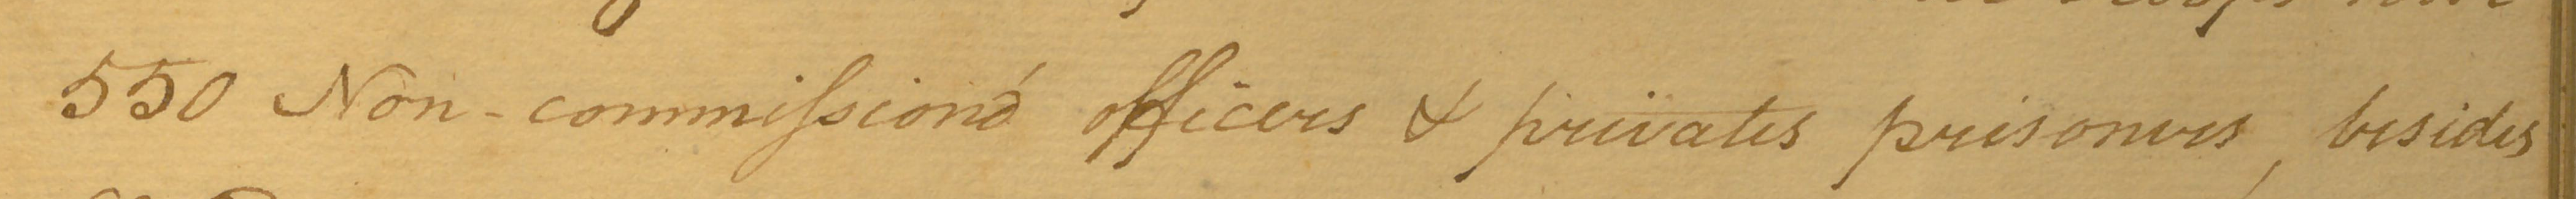550 Non-commission'd officers & privates prisoners, besides
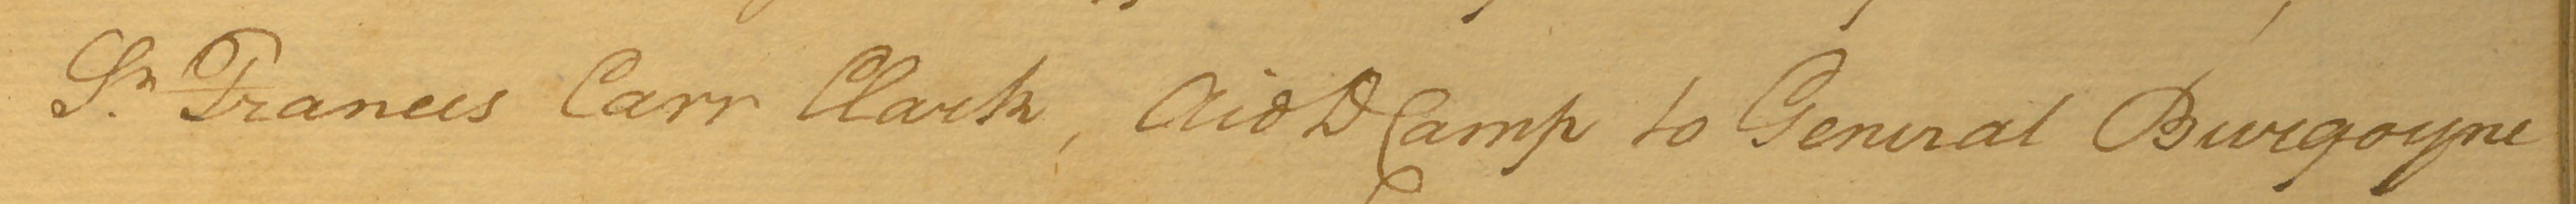S^r. Frances Carr Clark, Aid D Camp to General Burgoyne
